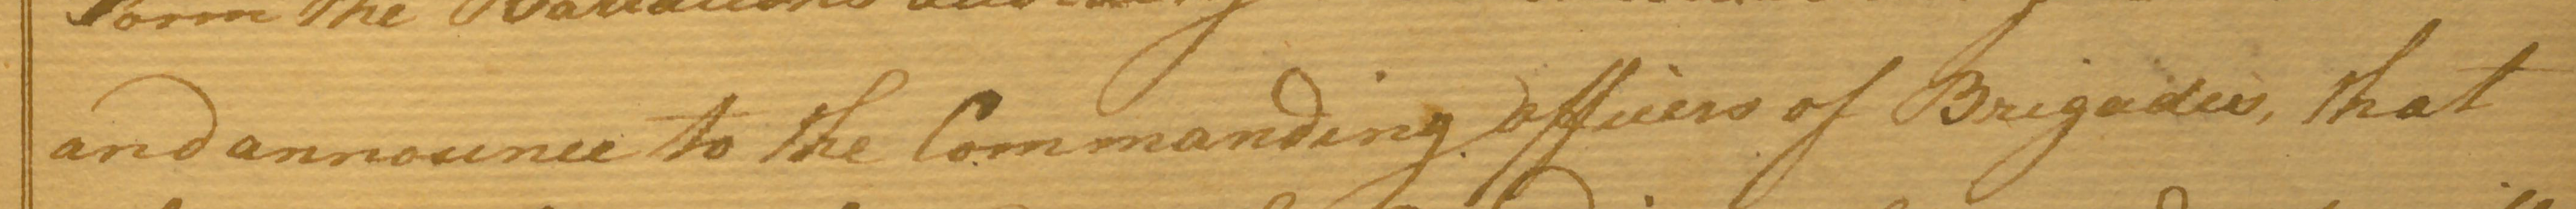and announce to the Commanding officers of Brigades that
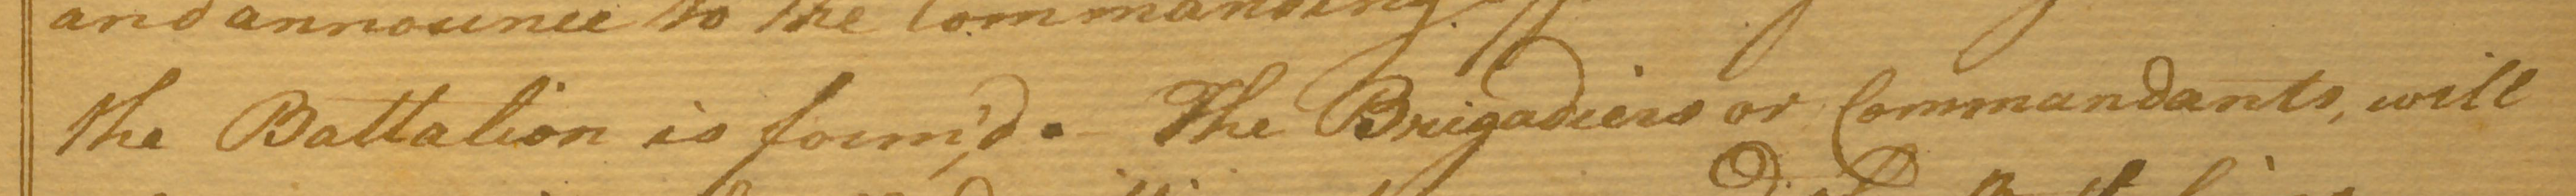the Battalion is form'd. The Brigadiers or Commandants will
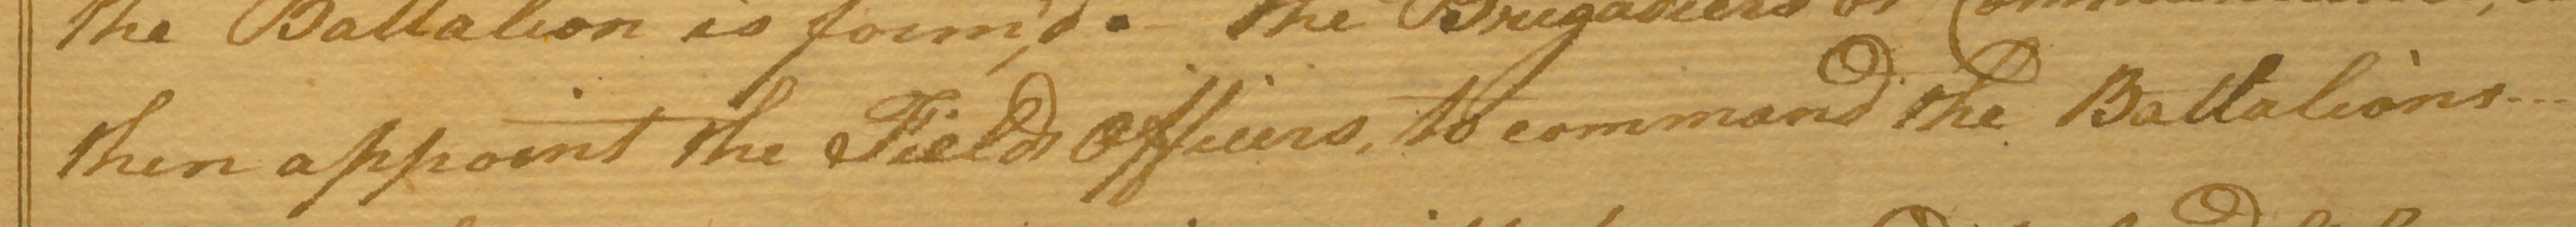then appoint the Field Officers to command the Battalions.
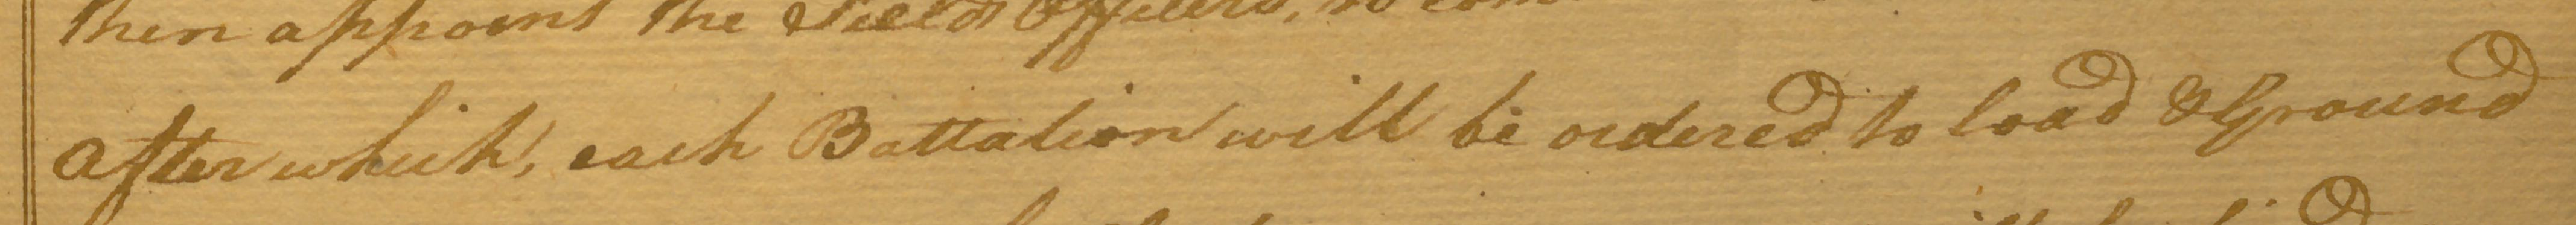After which, each Battalion will be ordered to load & Ground
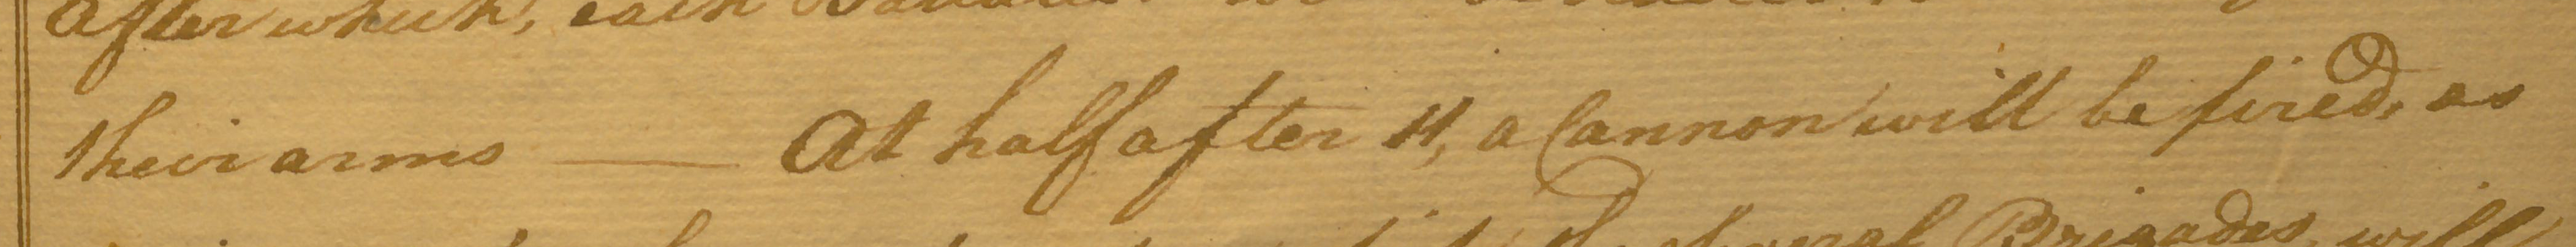their arms- At half after 11, a Cannon will be fired, as
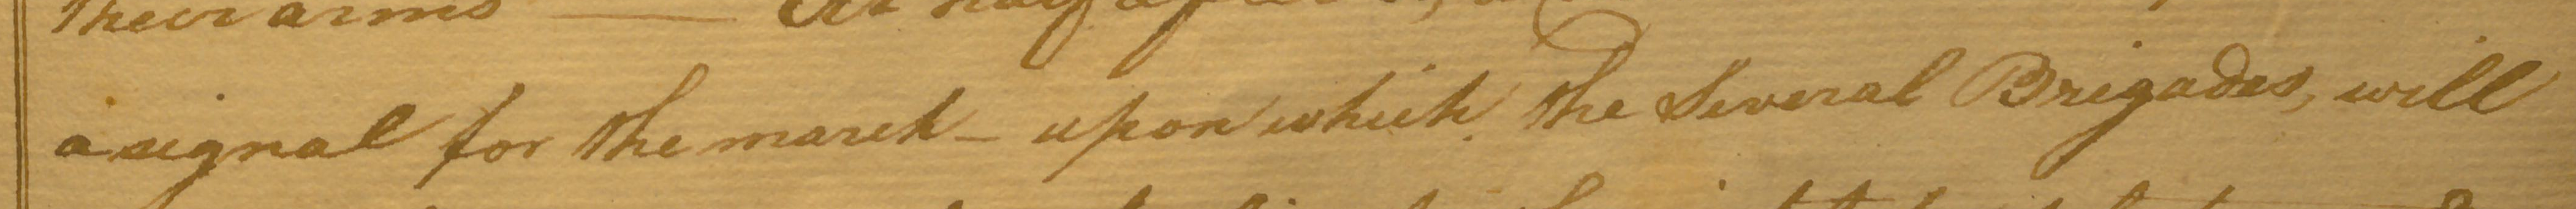a signal for the march- upon which the Several Brigades will
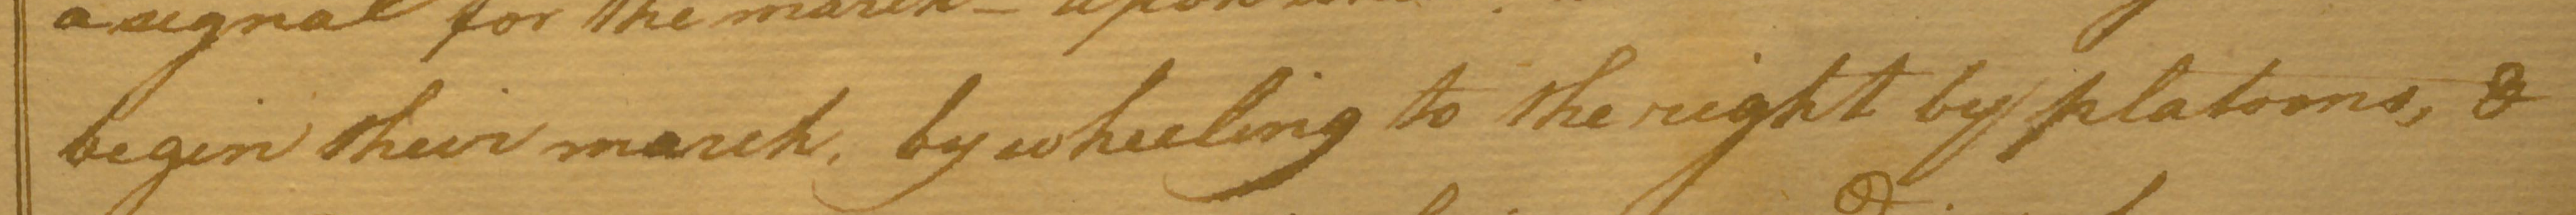begin their march by wheeling to the right by platoons, &
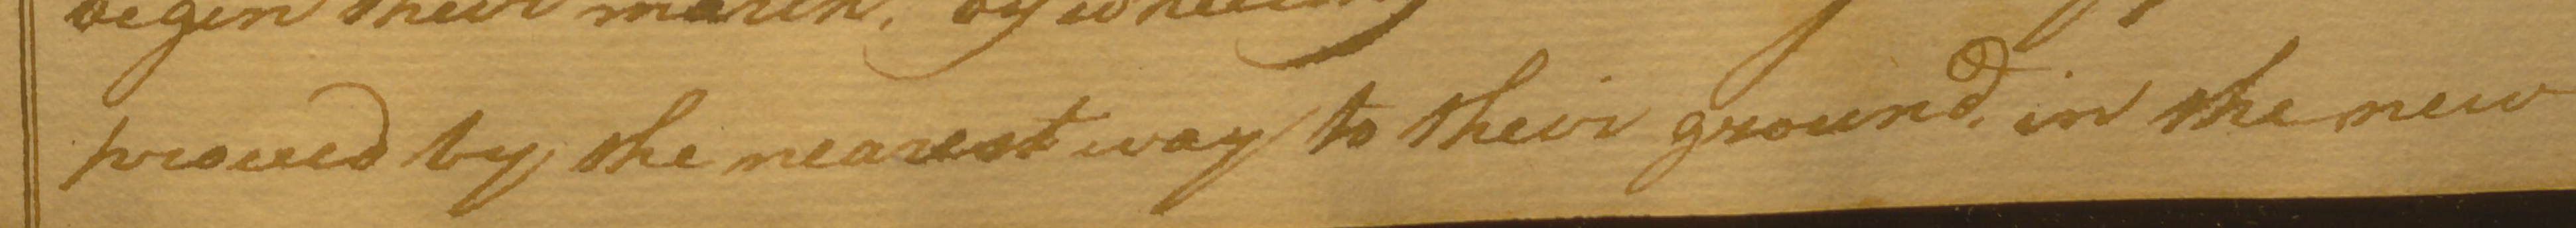proceed by the nearest way to their ground in the new
